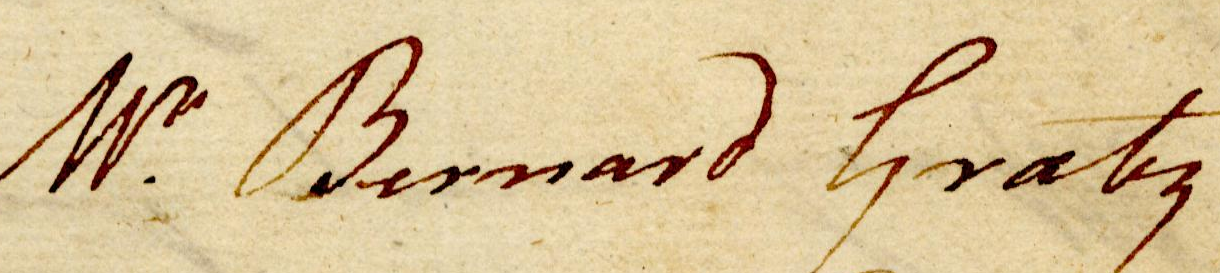M^r Barnard Gratz
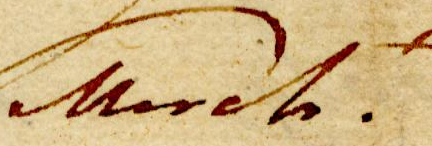Merch^t.
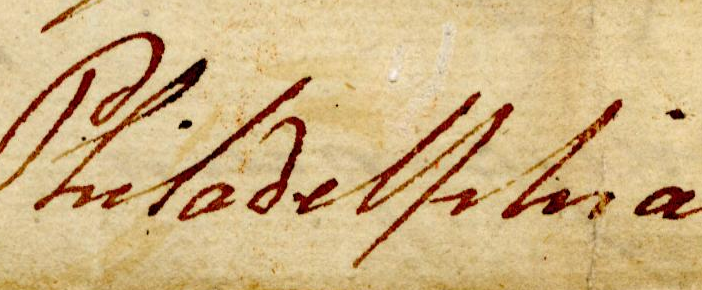Philadelphia
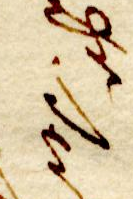D^r Sir
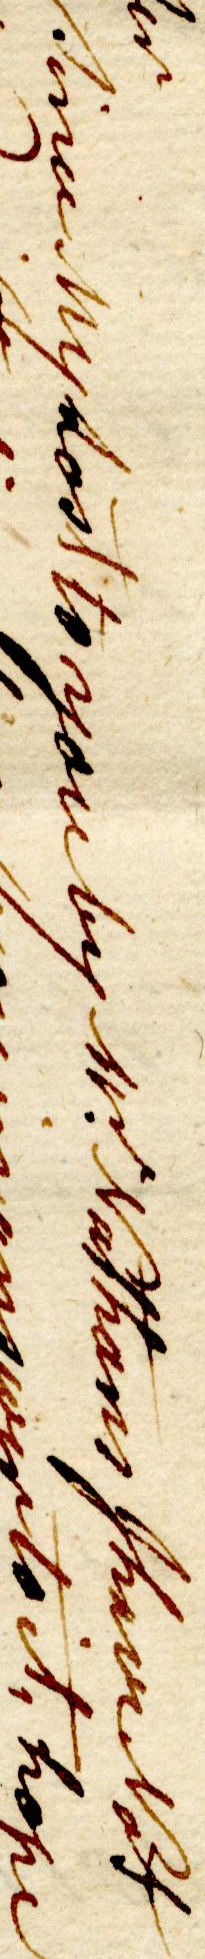Since my last to you by M^r. Nathans I have Not
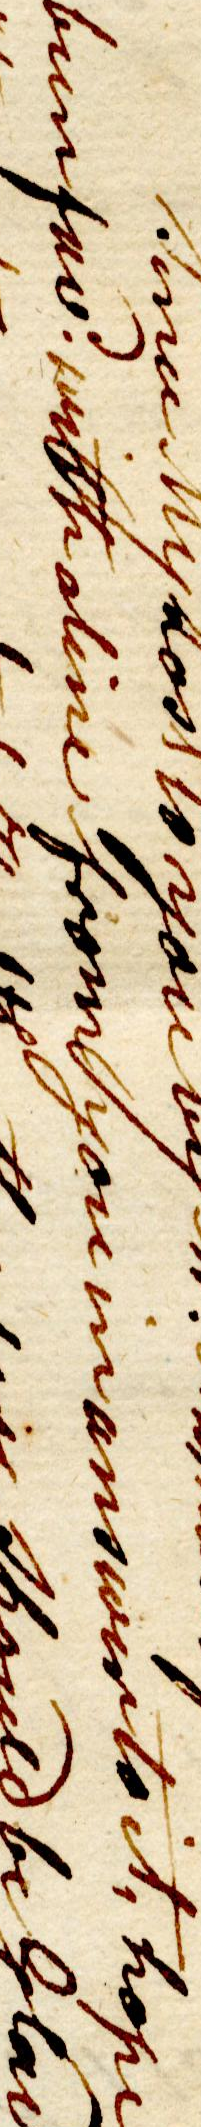been fav^d. with a line from you in answer to it, hope
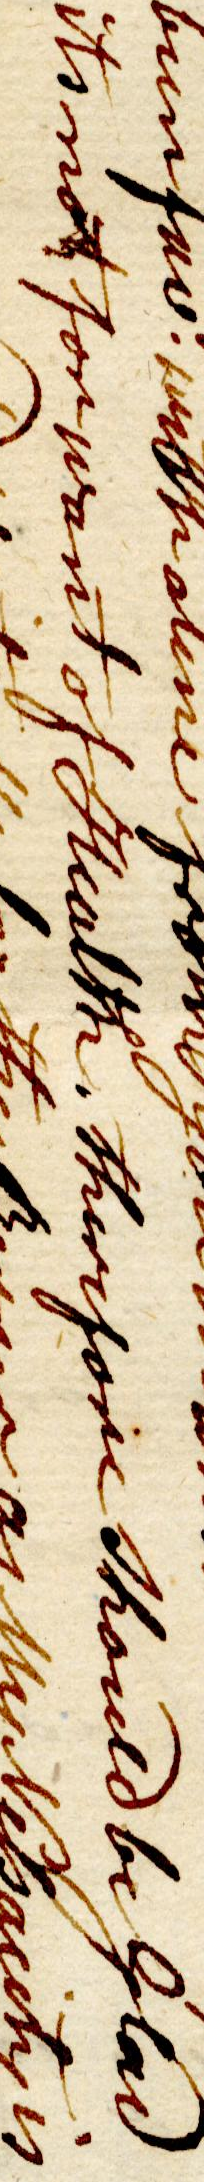its not for want of Health. therefore should be glad
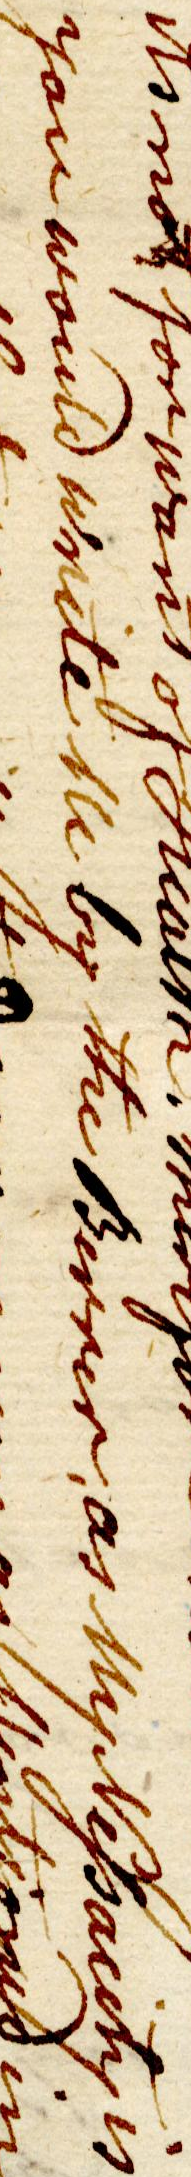you would write me by the Bearer, as My necessity is
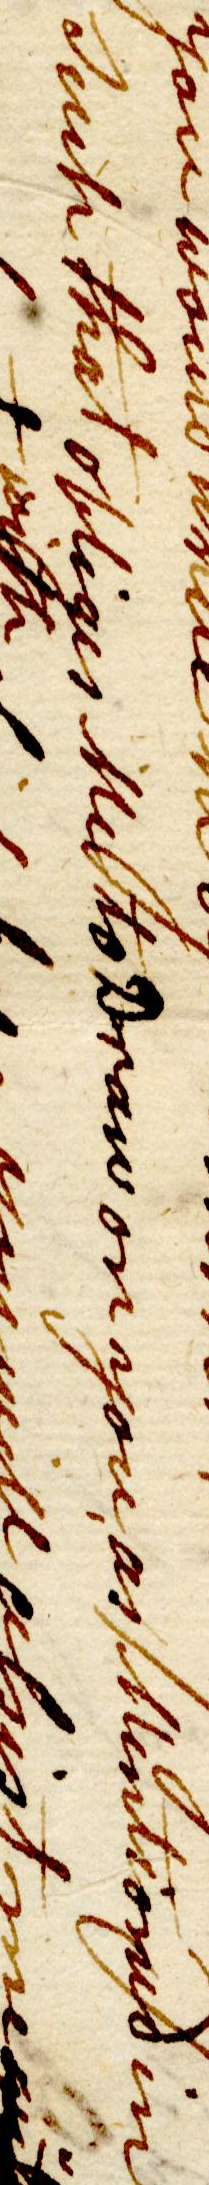such that obliges me to Draw on you, as Mentioned in
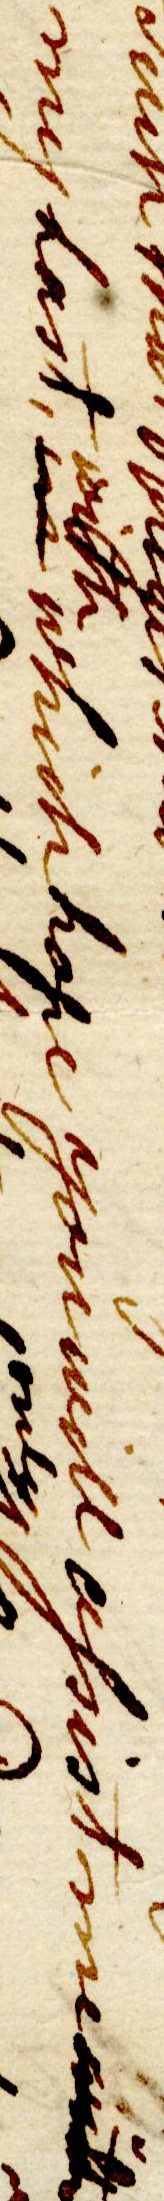my last with which hope you will assist me [with]
